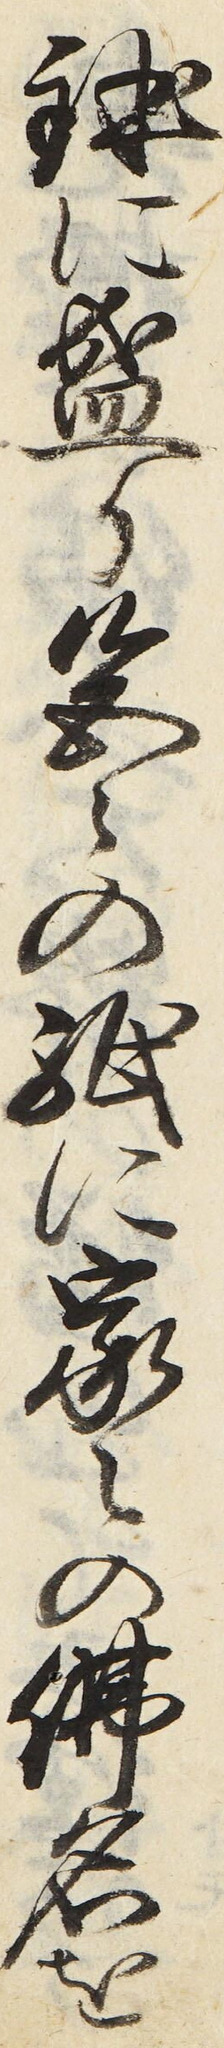鉢に盛り色々の紙に家々の仏名を
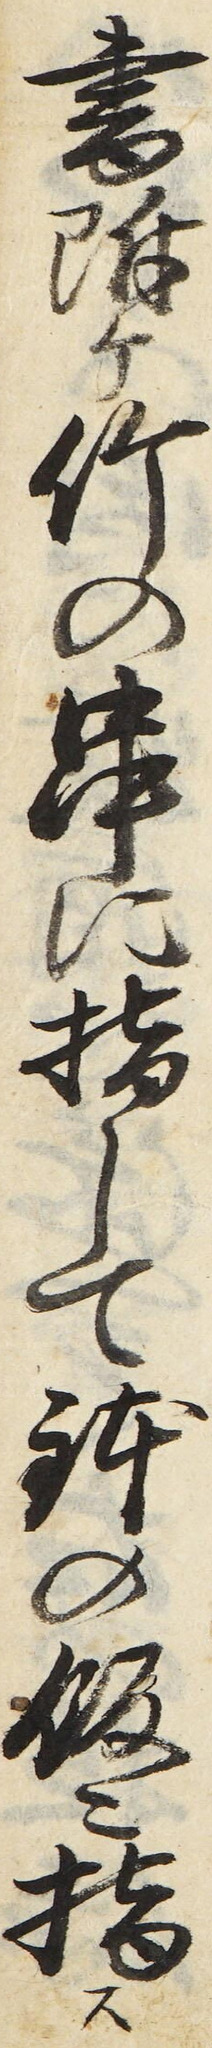書附け竹の串に指して鉢の飯に指す

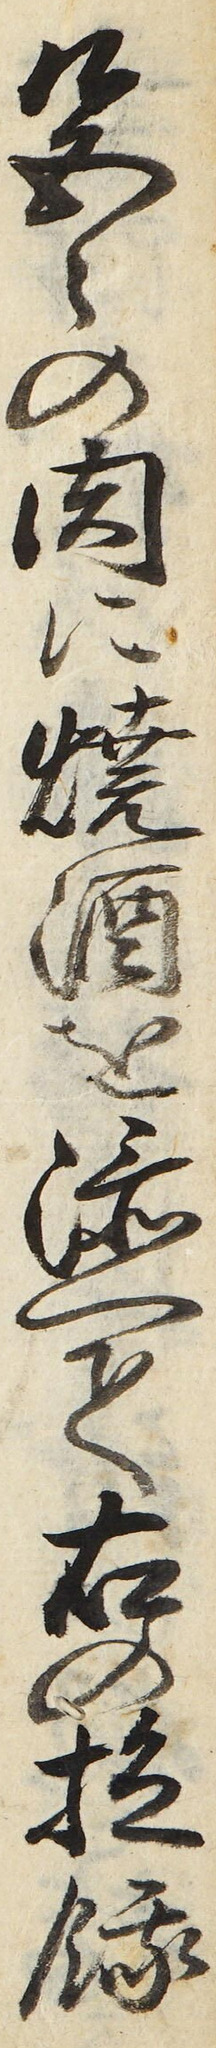色々の肉に焼酒を添へて右の施餓
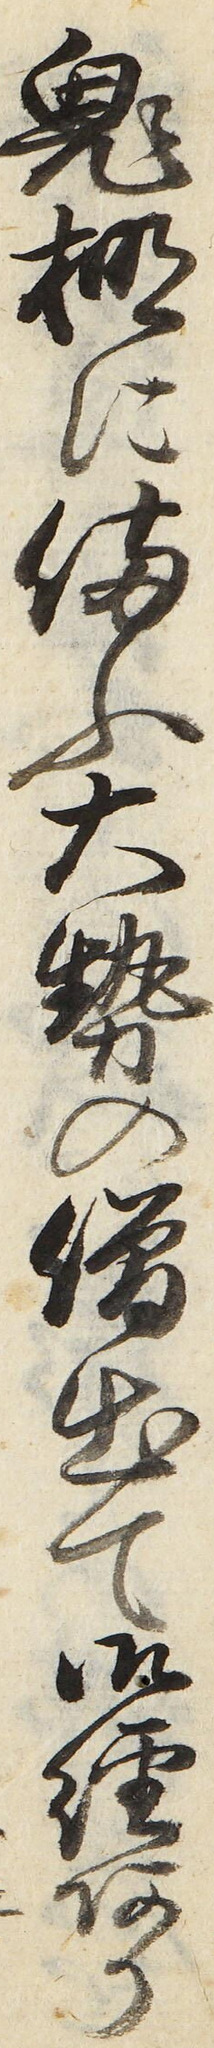鬼棚に備ふ大勢の僧出て御経あり
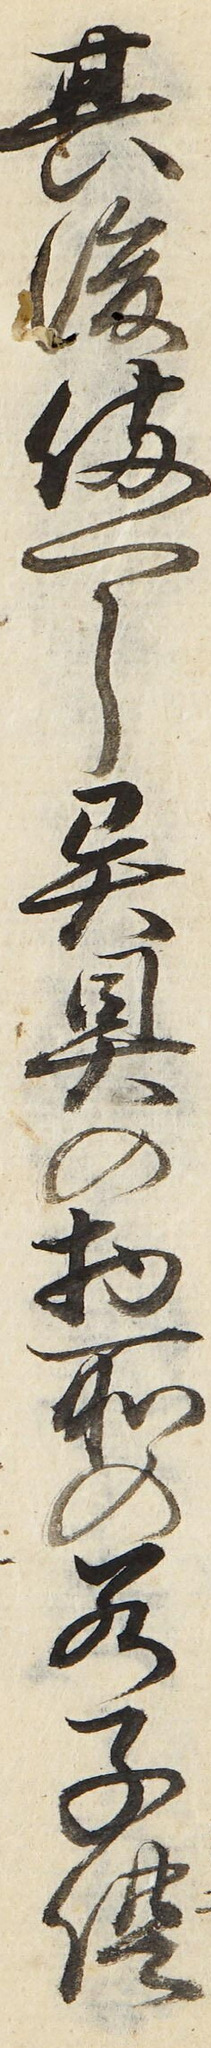其後備へし異具の物所の若子供
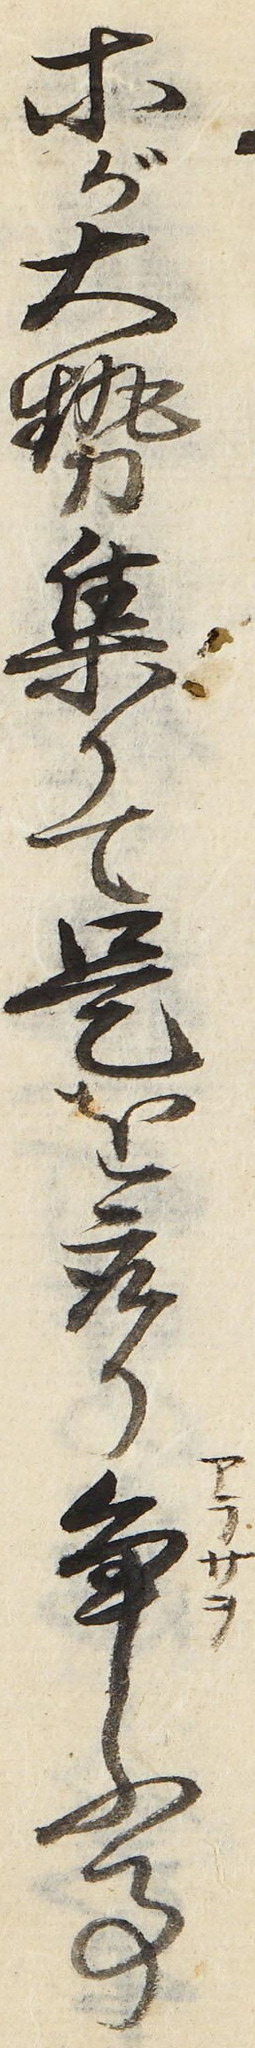等が大勢集りて是を取り争ふ事
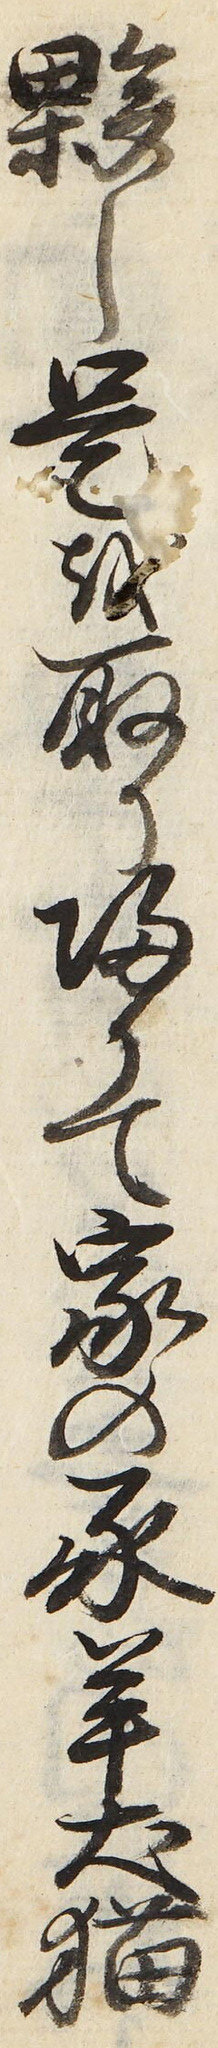夥し是を取帰りて家の豕羊犬猫
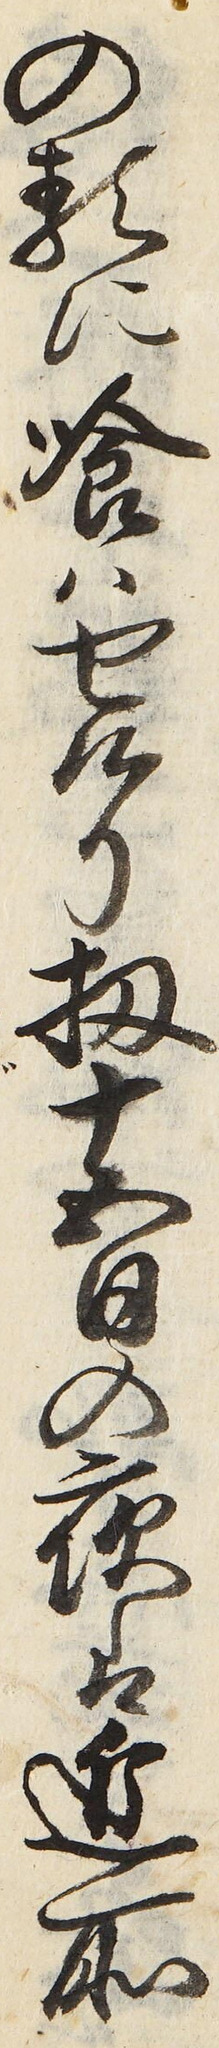の類に喰はせけり扨十五日の夜は近所
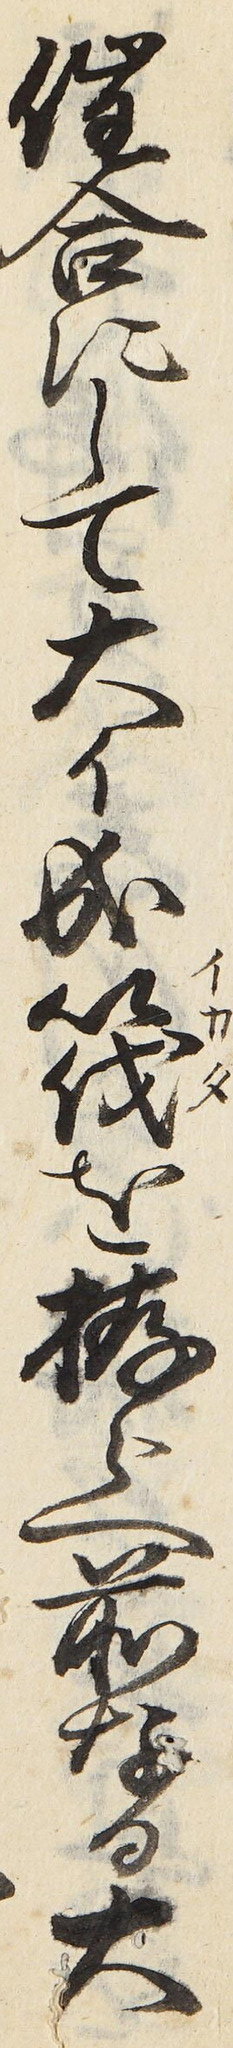催合にして大い成筏を拵らへ前なる大
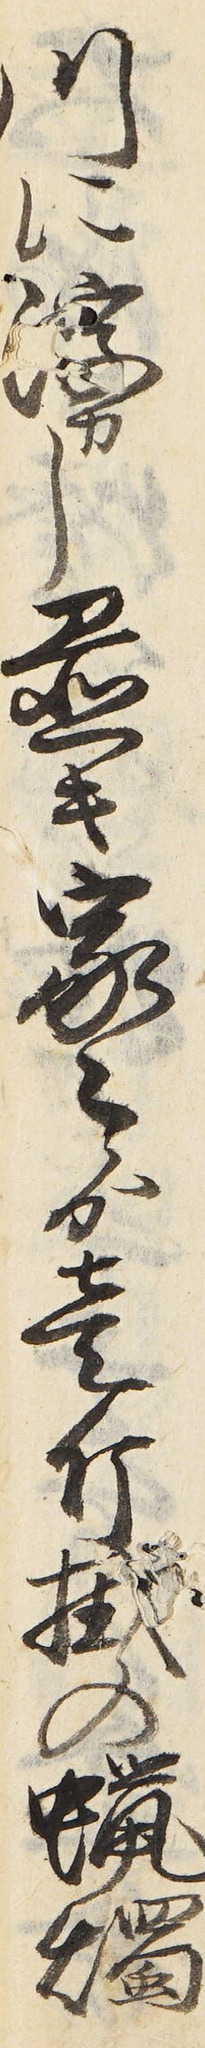川に浮かし置き家々ゟ壱斤掛の蝋燭
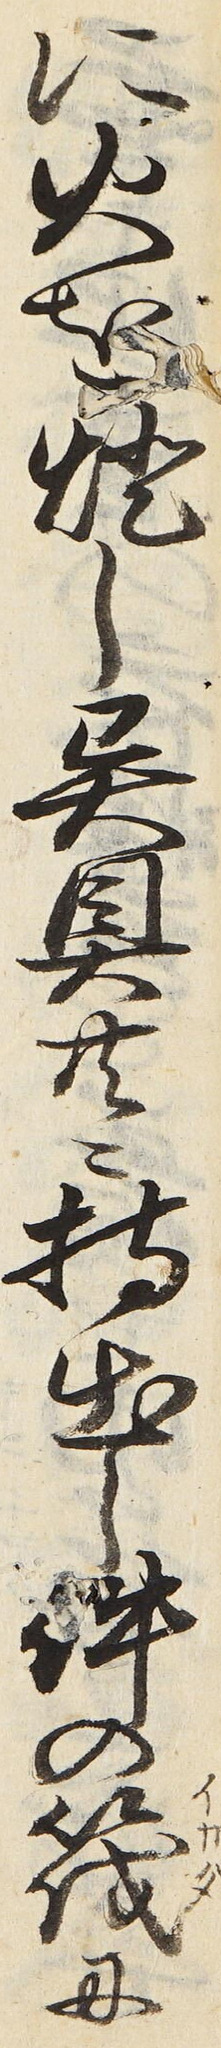に火を燈し異具共に持出し件の筏に
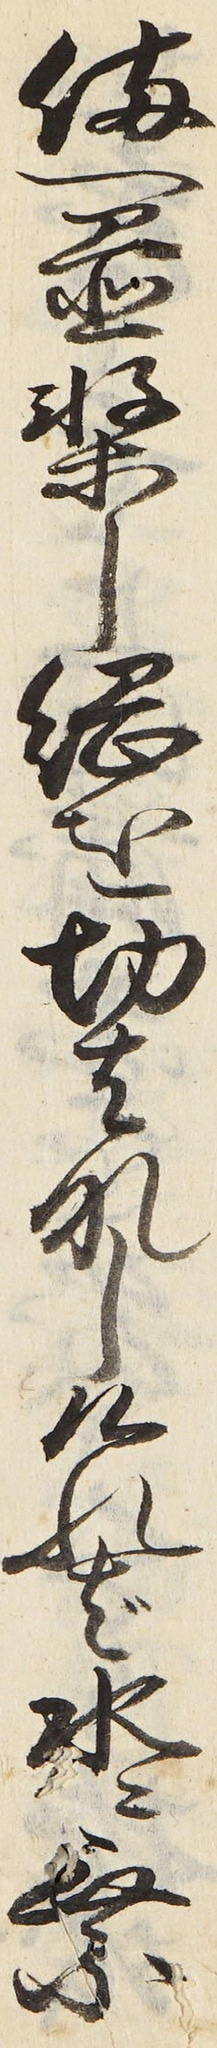備へ置繋し綱を切はなしければ水に乗
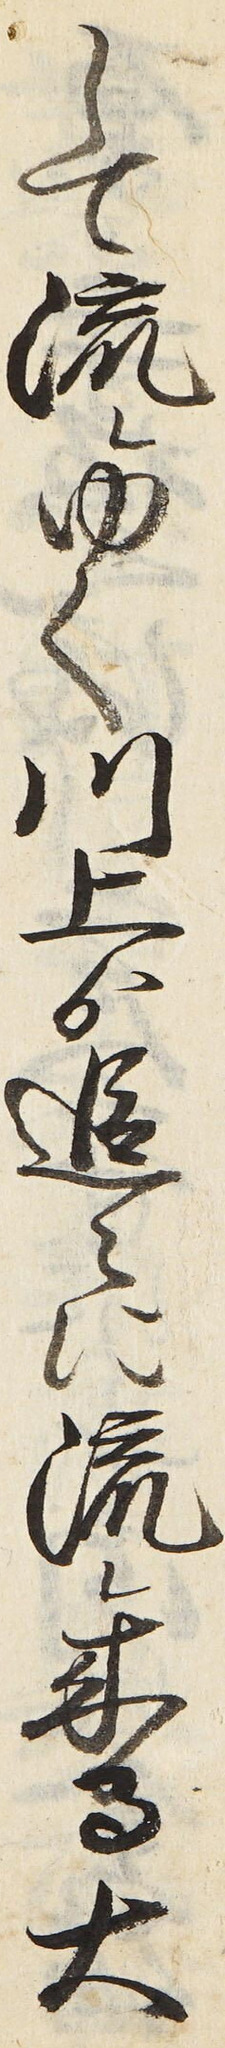して流れゆく川上ゟ追々に流れ来る大
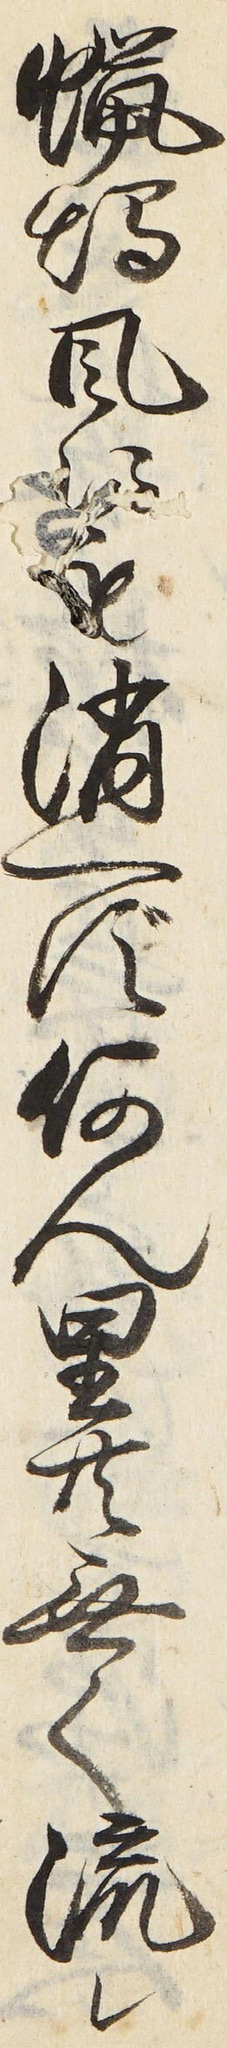蝋燭風にも消へず何ん里共無く流れ
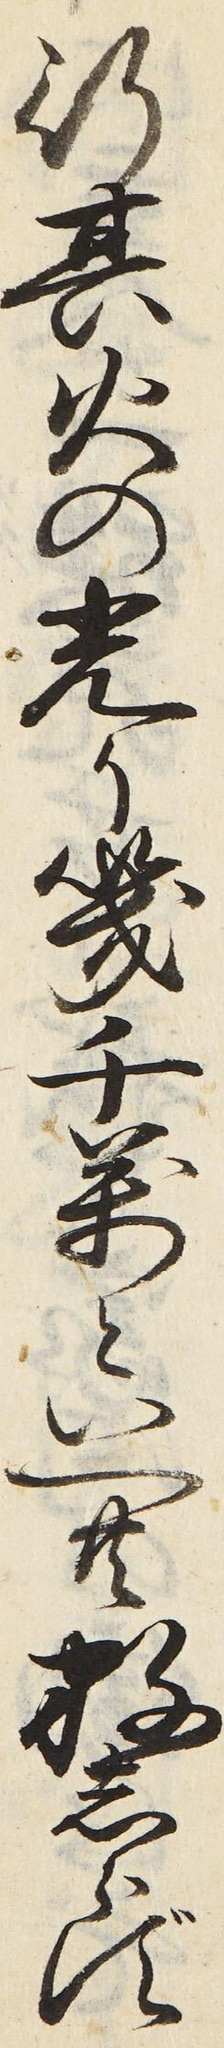行其火の光り幾千萬といへ共数しらず
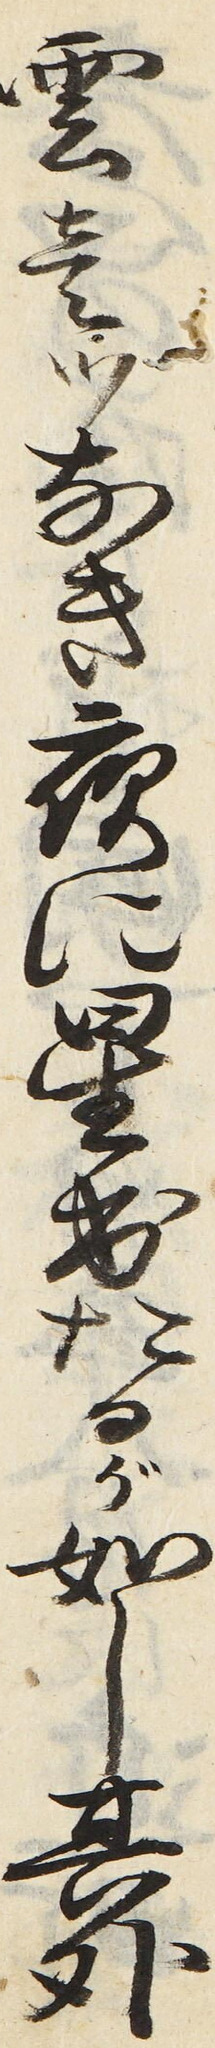雲壱ツ無き夜に星出たるが如し其外
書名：華夷九年録
